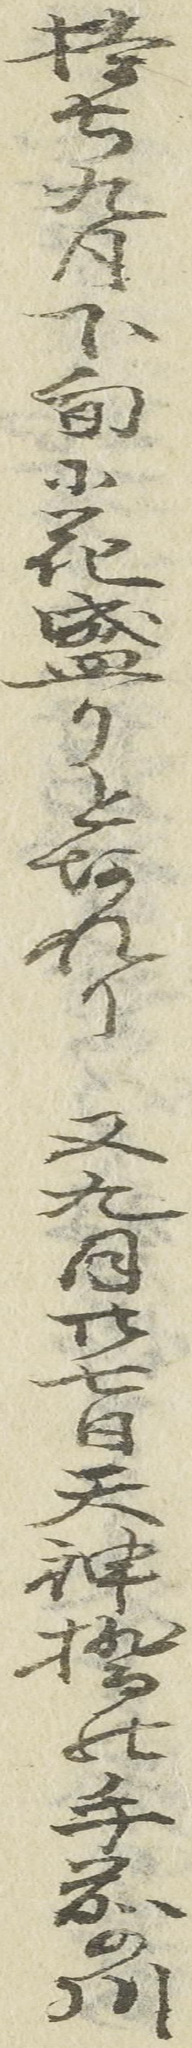持ち九月下旬に花盛りとなれり又九月廿七日天神橋の手前の川
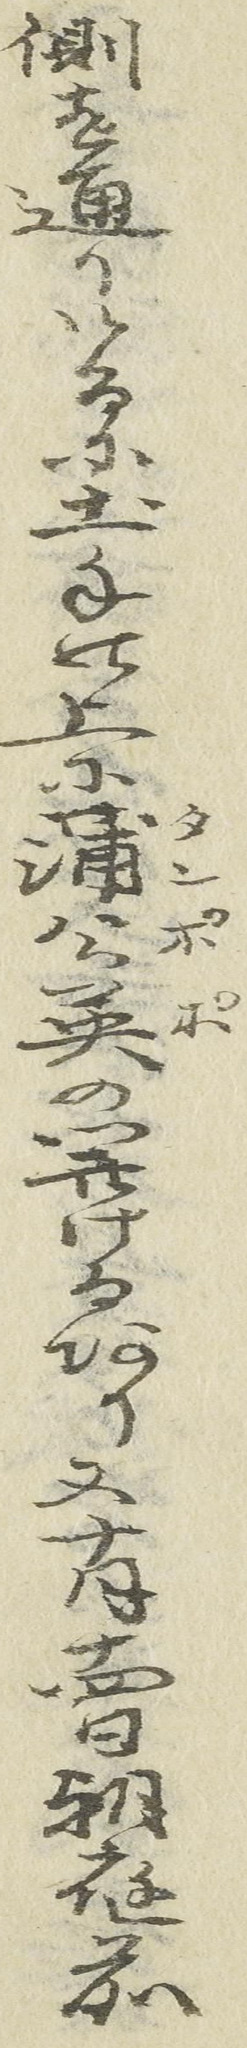側を通りけるに土手の上に蒲公英の開けるなり又十月十四日朝庭前
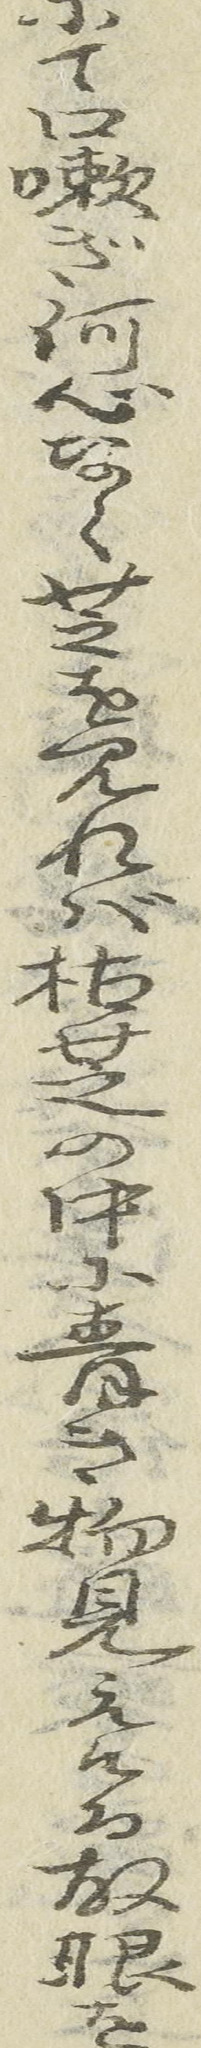にて口嗽ぎ何心なく芝を見れば枯芝の中に青き物見えける故眼を
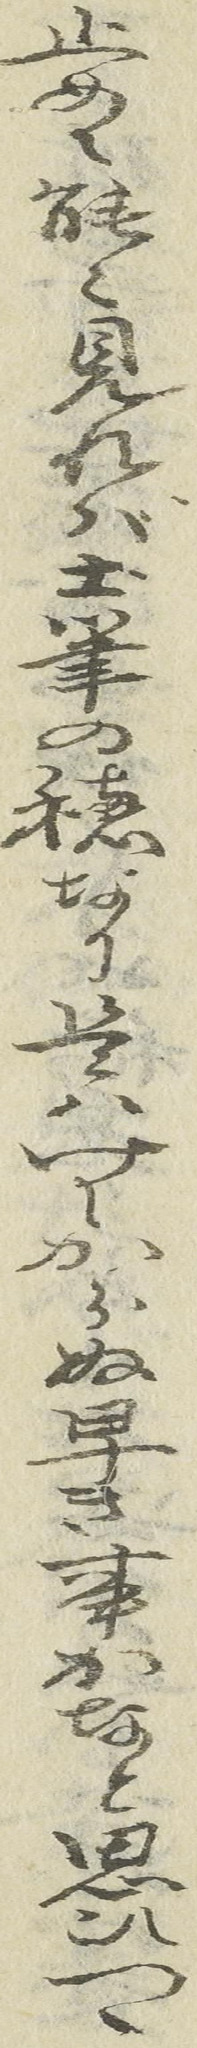止めて能々見れば土筆の穂なり是はけしからぬ早き事かなと思ひつゝ
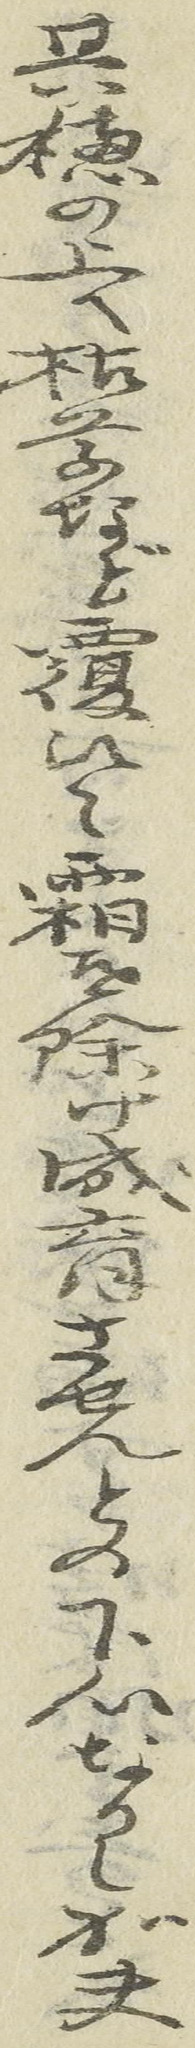其穂の上へ枯草など覆ひて霜を除け成育させんとの下心なりしが夫
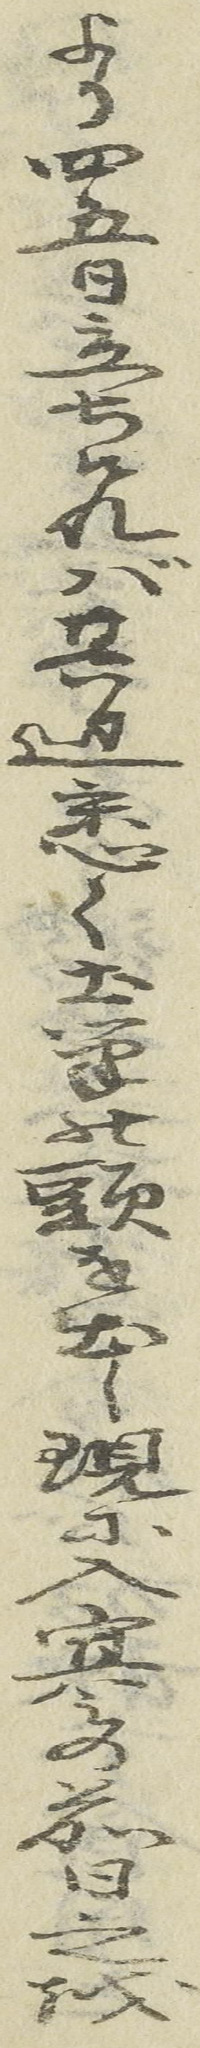より四五日立ちければ其道悉く土筆の頭を出し現に入寒の前日之を

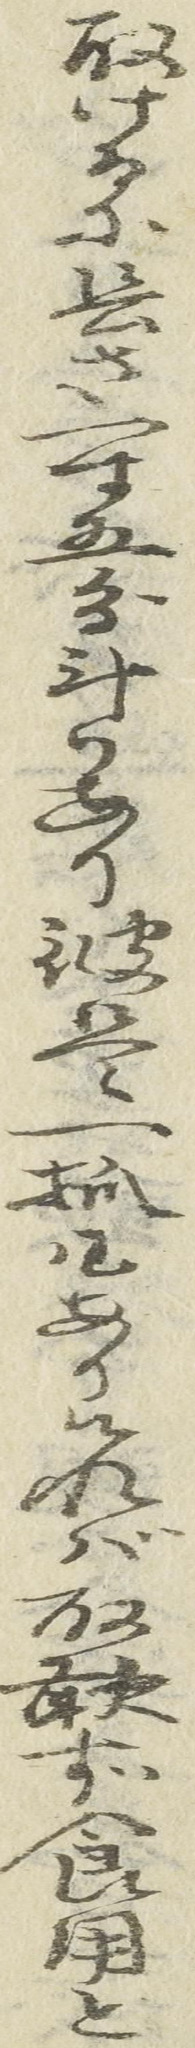取けるに長さ一寸五分計りあり彼是一抓もありければ取敢ず食用と
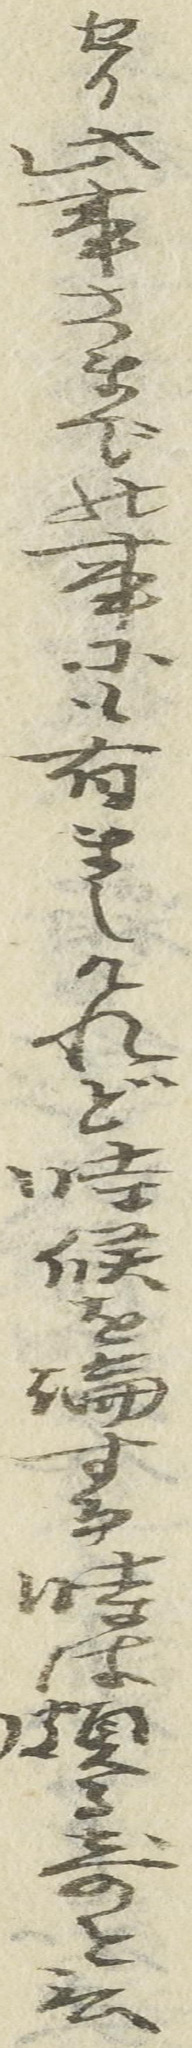せり此事さまでの事にも有ましけれど時候を偏する時は頗る奇と云
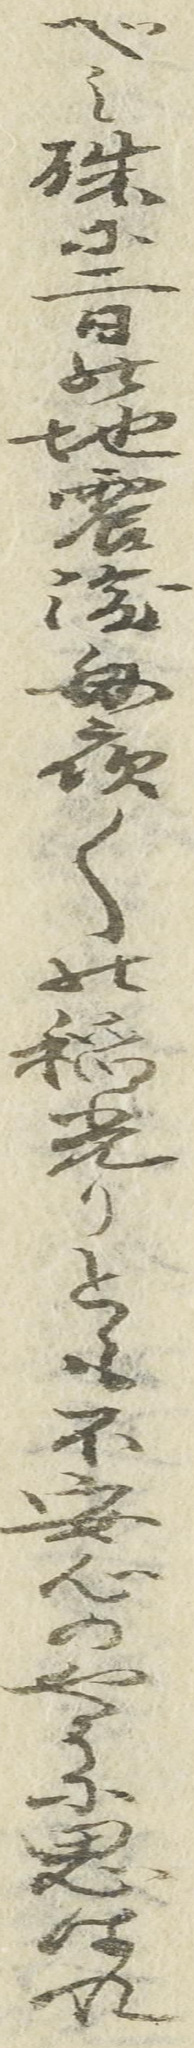べし殊に二日の地震後毎夜〳〵の稲光りとも不安心のやうに思はれ
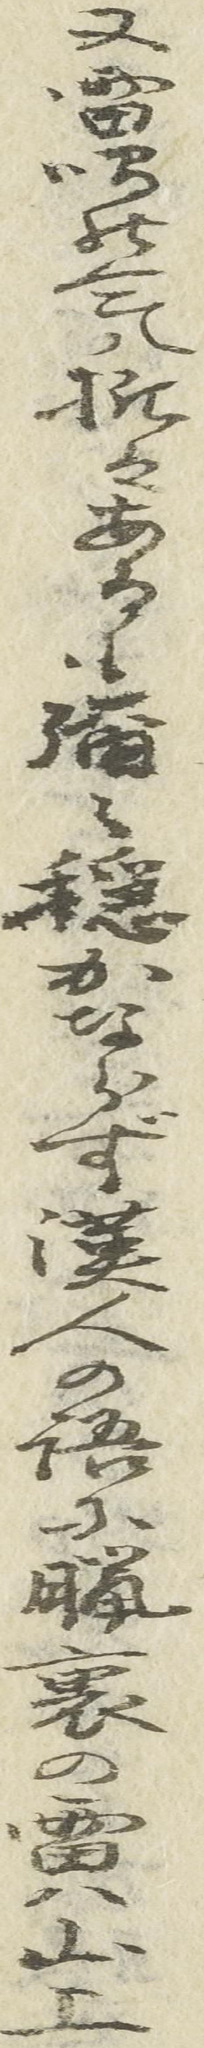又雷鳴の気折々あるも彌々穏かならず漢人の語に臘裏の雷は山上
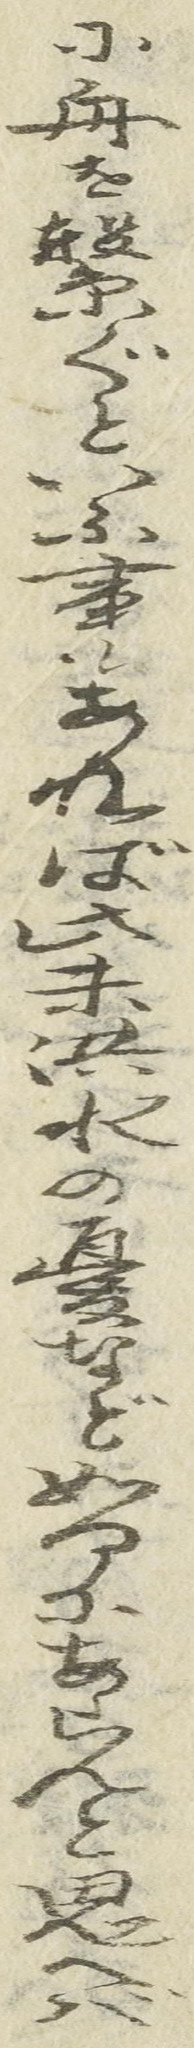小舟を繋ぐといふ事もあれば此未洪水の憂など如何にあらんと思へば
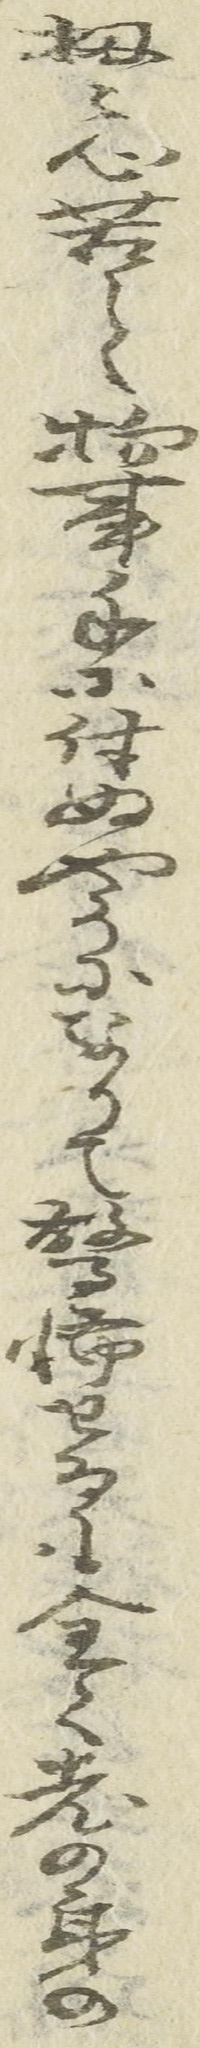扨々心苦しく物事手に付ぬやうになりて驚怖せるも全く老の身の
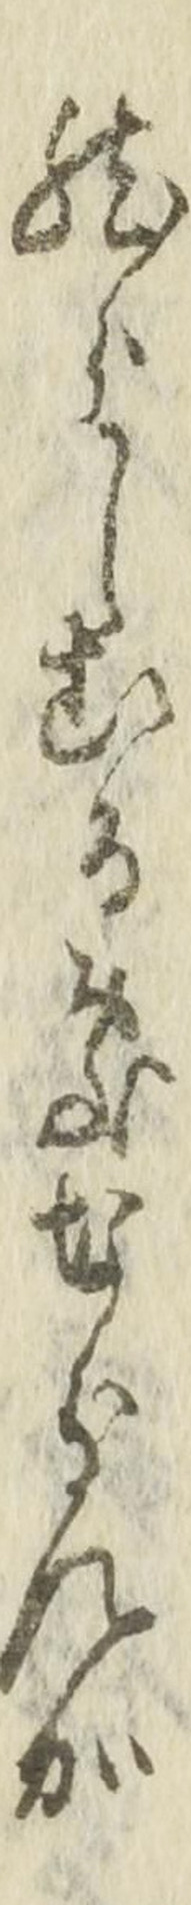然らしむる處ならんが
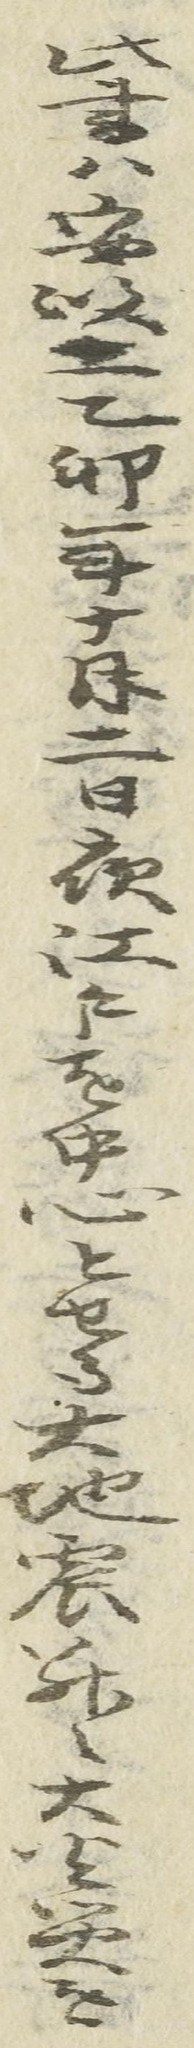此書は安政二乙卯年十月二日夜江戸を中心とせる大地震并ニ大火災を
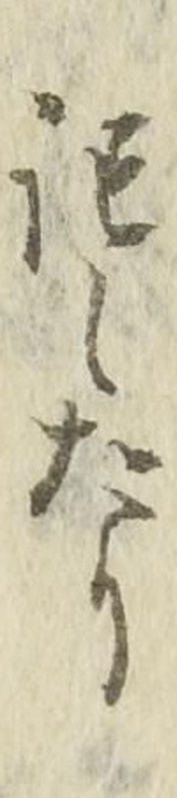記したり
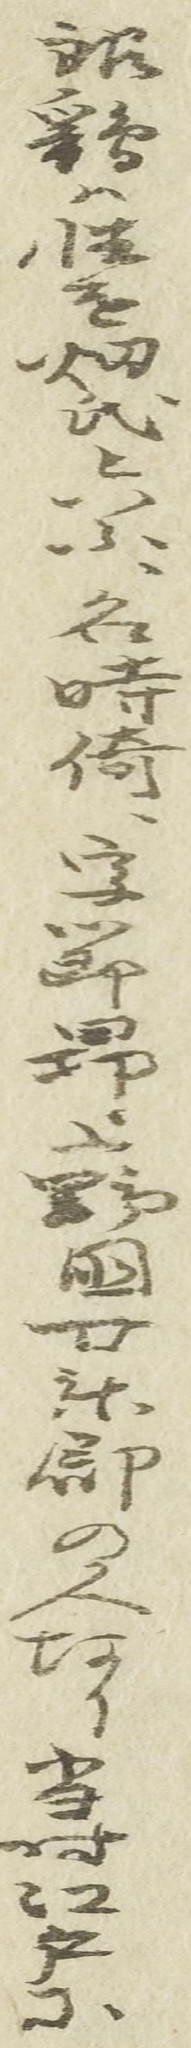銀鶏は性を畑氏といふ、名時倚。字節昻。上野国甘楽郡の人なり当時江戸に
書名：地震前兆集　全
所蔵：東京大学地震研究所図書室 Earthquake Research Institute Library, The University of Tokyo, JAPAN
